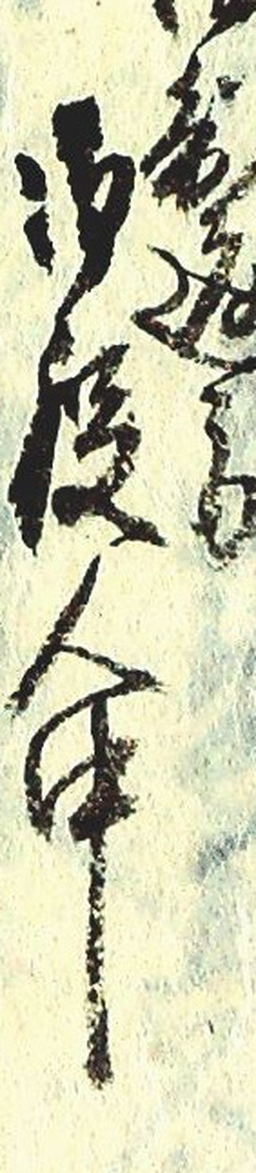御役人中
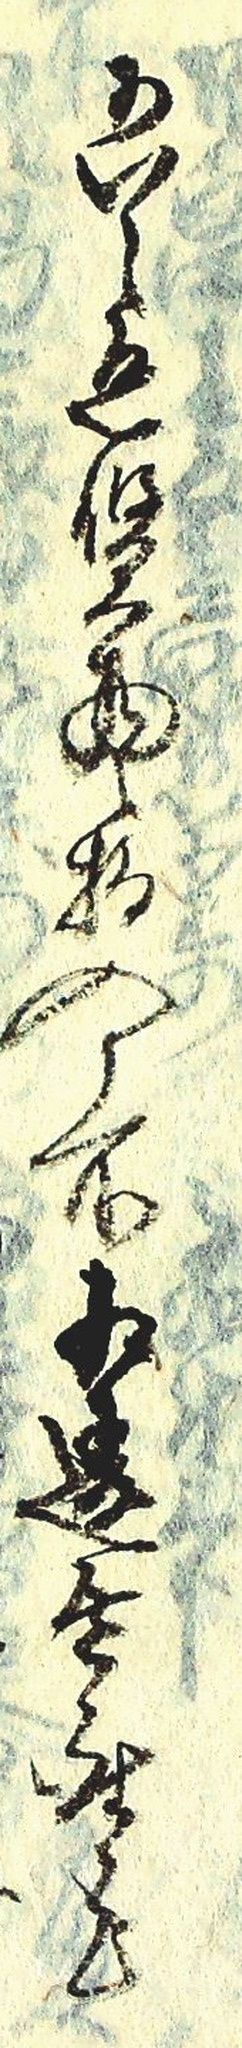右之通質物に指入申所相違無御座候以上
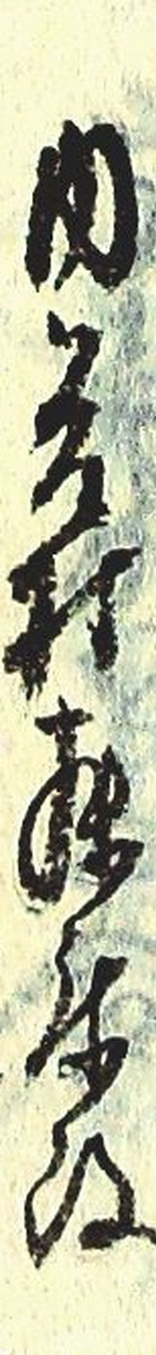内谷村寐床改
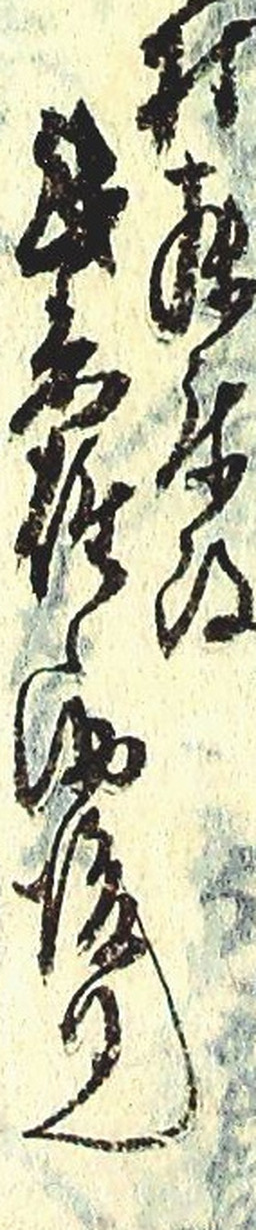武知雄之助後見
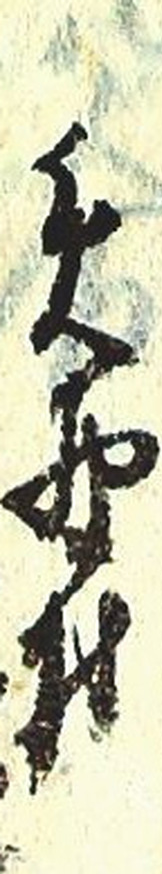矢野村
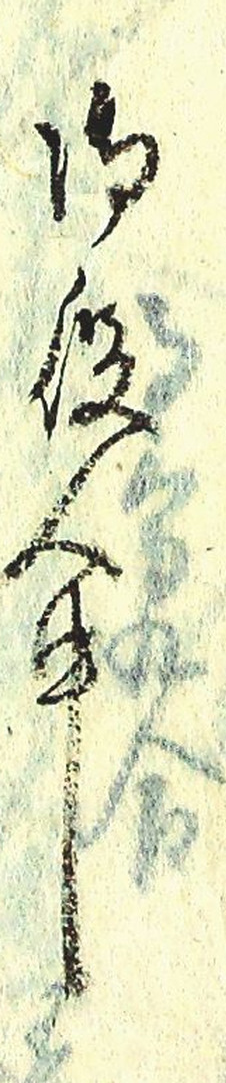御役人中
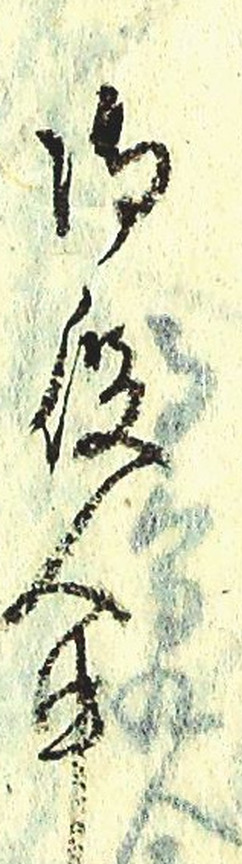御役人中
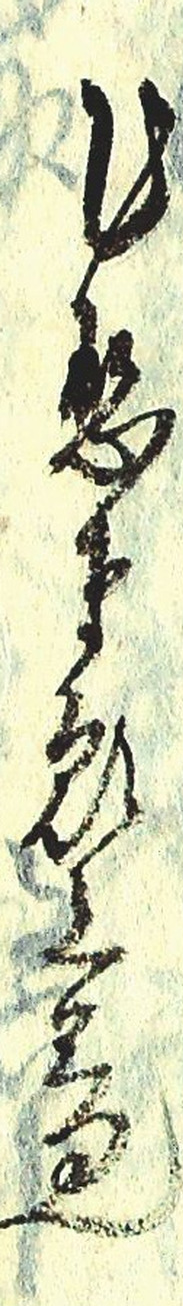乍恐奉願上覚
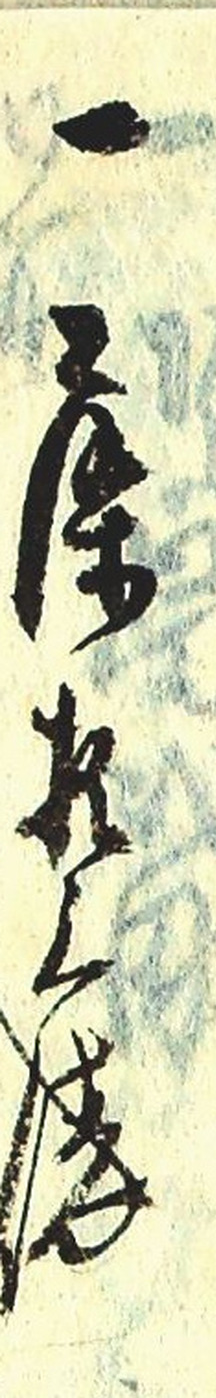一蒅拾三俵
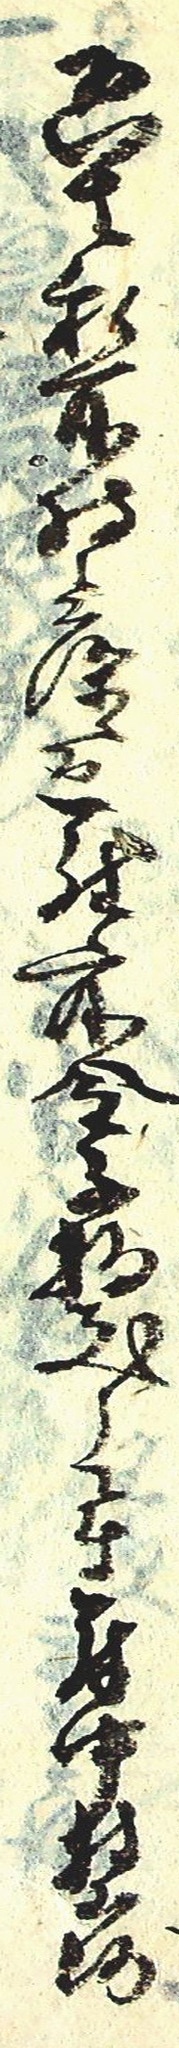右は私所持之蒅にて御座候所金子指支申に付府中村玉師
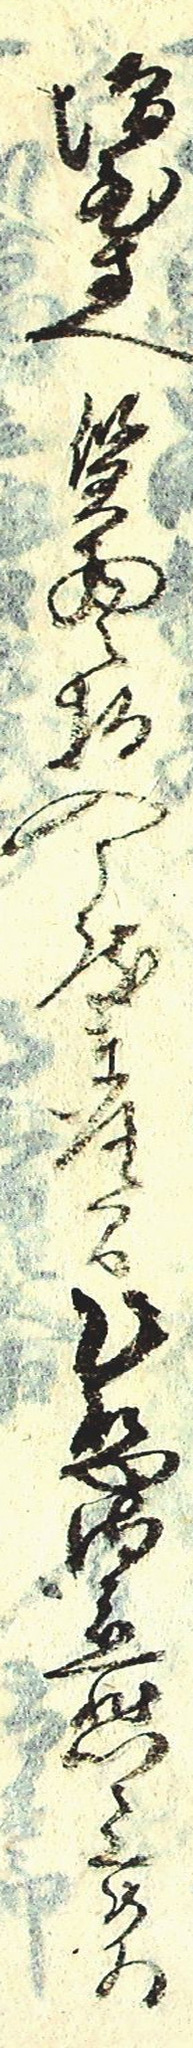増屋方へ質物に指入申度奉存候間乍恐御慈悲之上被為
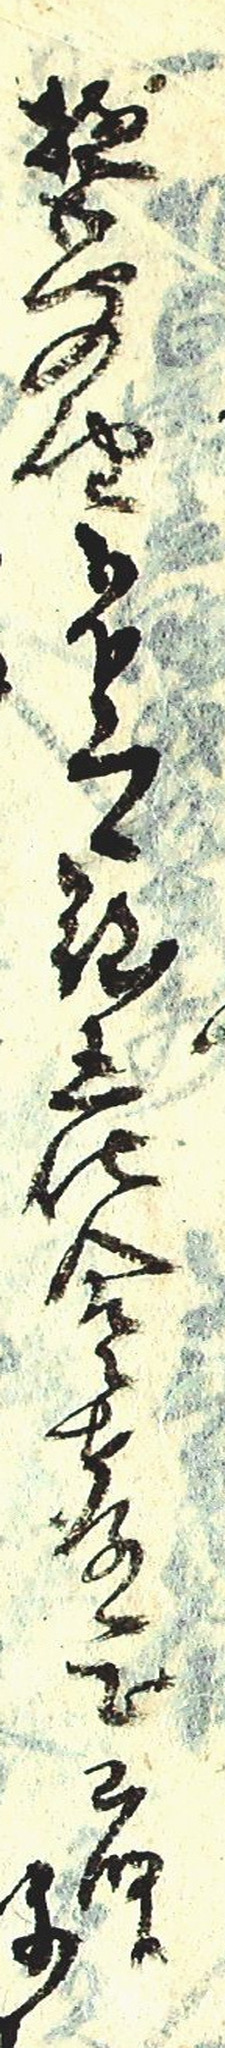遊御聞届被下候はゝ難有仕合に奉存候以上
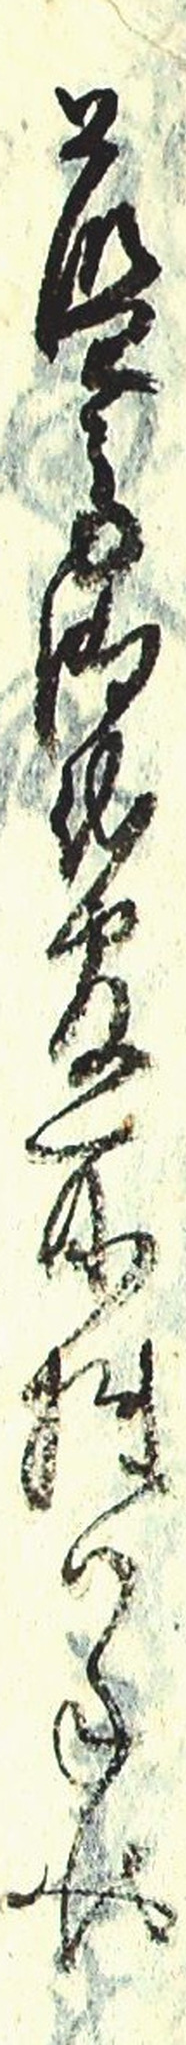藍方御代官所様御手代
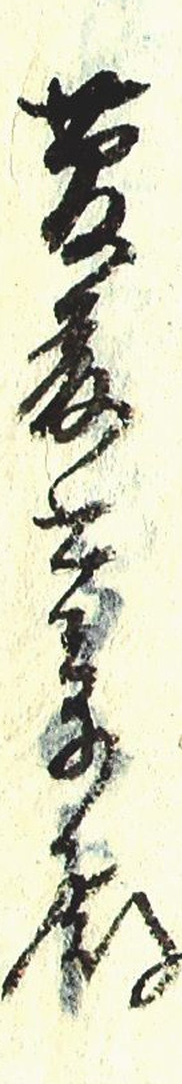菅藤六兵衛殿

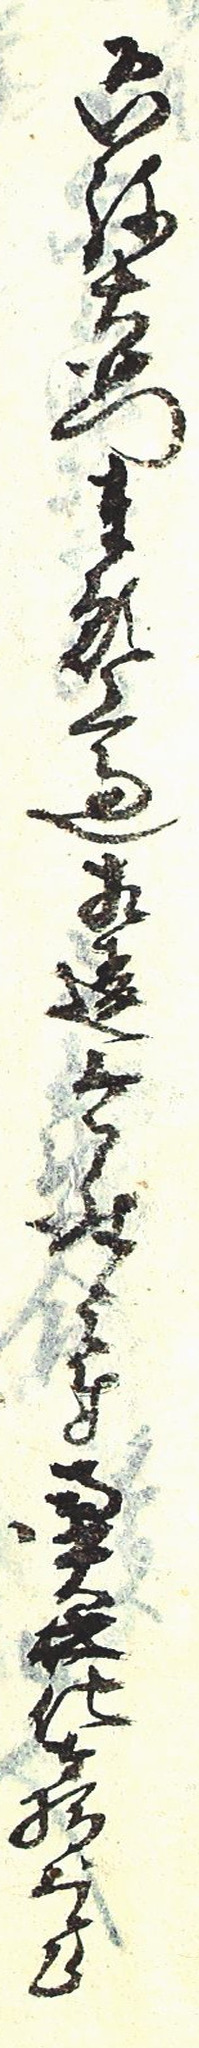右弥右衛門奉願上通相違無御座候に付奥書仕奉指上候以上
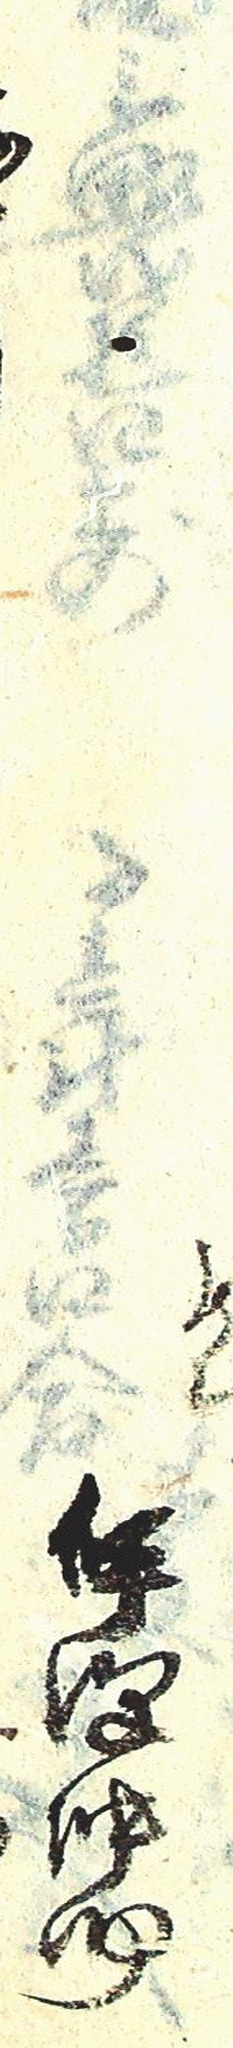伊沢仲助
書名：諸御願書控(弐番）
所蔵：鳴門教育大学 Naruto University of Education
